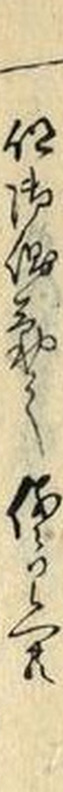但御側勤之儀ニハ候へ共
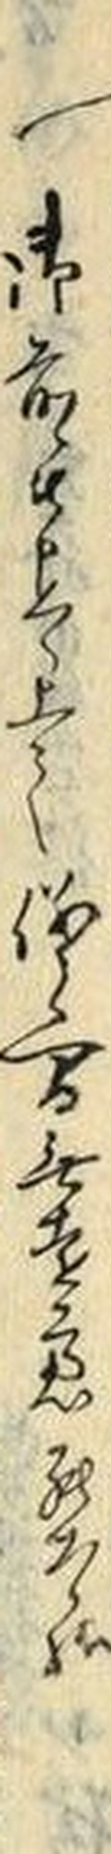御前被申上候上之儀ニ候間無遠慮罷出候様
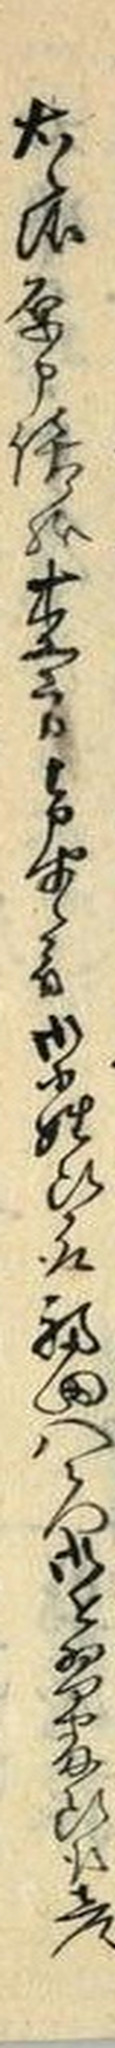右之趣厚申談候様木工方被申聞候ニ付御小姓頭取福田八右衛門御近習番頭取彦
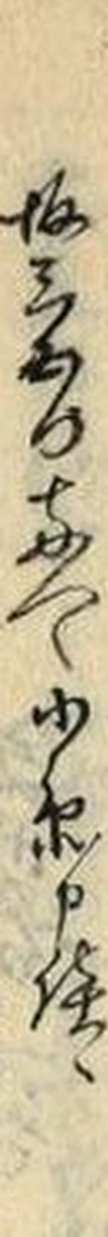坂三五右衛門両人へ小兵衛申談候

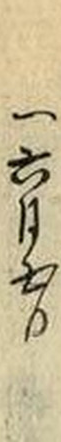一六月五日
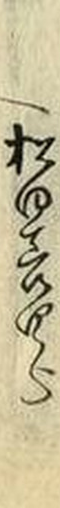松田善四郎
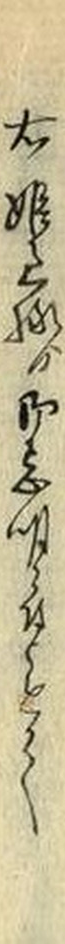右姫君様ゟ御忌明ニ付被進之
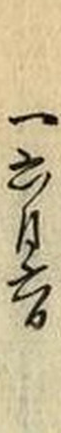一六月六日
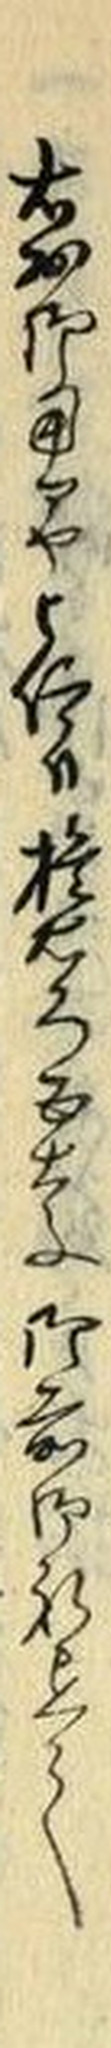右於御用部や被仰付権右衛門五太夫御前御礼申上之
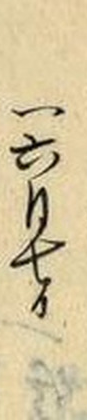一六月七日
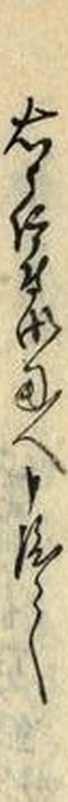右被仰付御用人申渡之
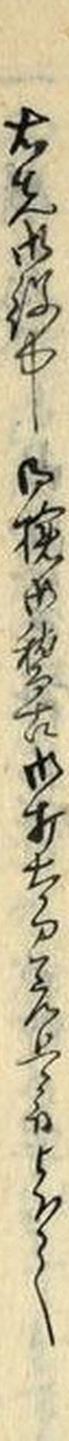右先御役中御槍御稽古御打太刀差上候ニ付被下之
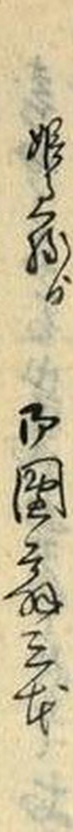姫君様ゟ御団扇三本
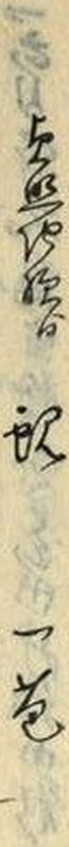貞照院様ゟ蜆一苞
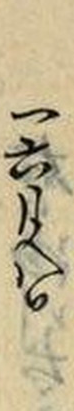一六月五日
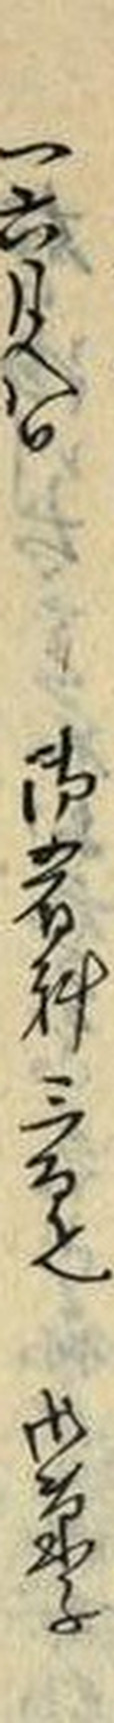一六月八日御肴料三百疋御菓子
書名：少傅日録抄（斉承付側向頭取日記、在府）
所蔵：福井県文書館 Fukui Prefectural Archives
